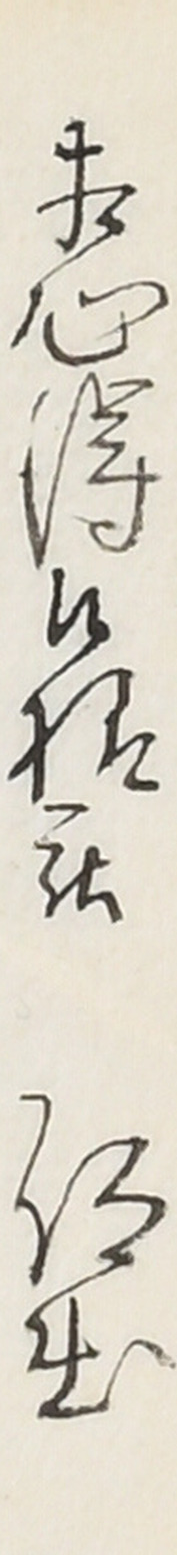相心得候様被仰出
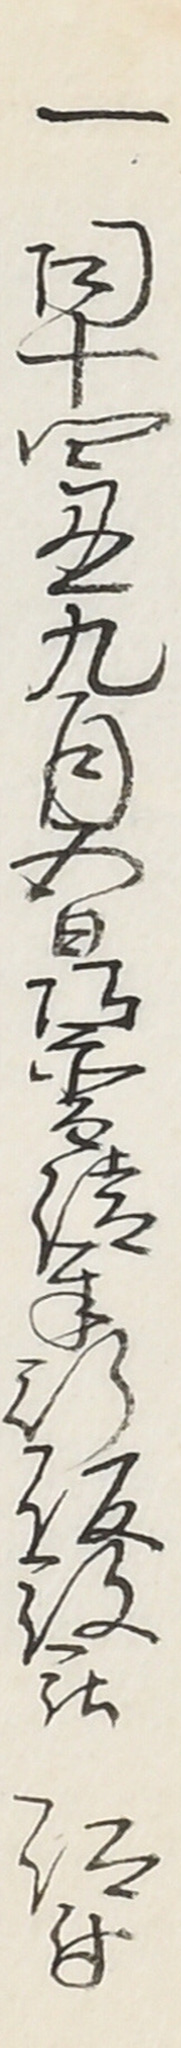一同十四丑九月五日御普請奉行仮役被仰付
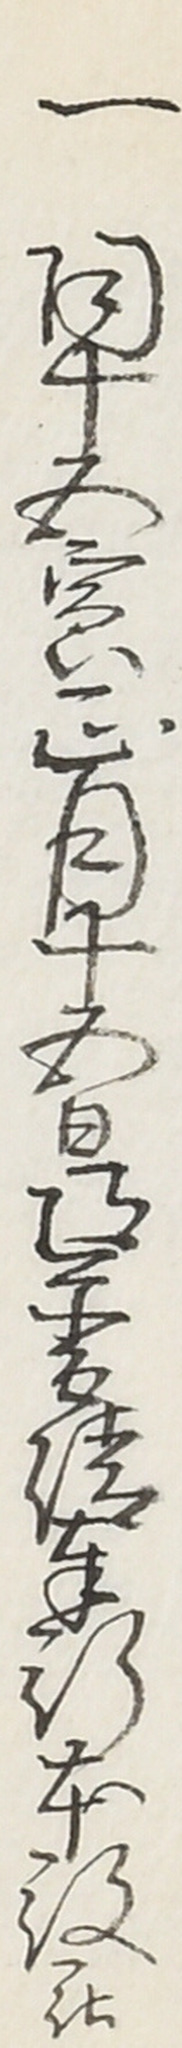一同十五寅正月十五日御普請奉行本役被
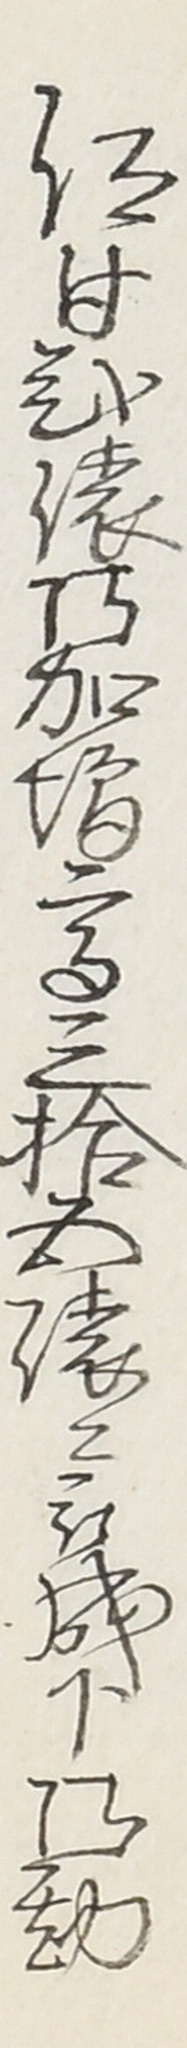仰付弐俵御加増高三拾五俵ニ被成下御勘
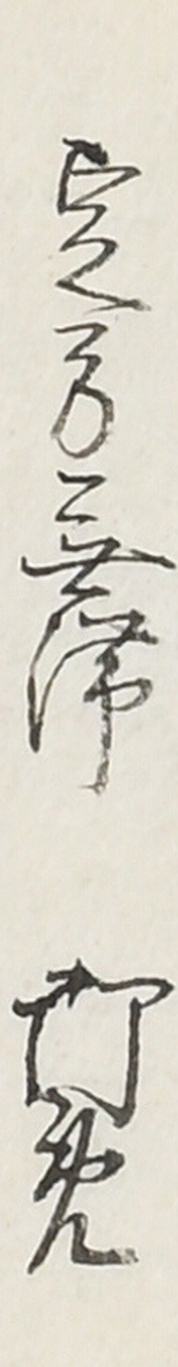定方無滞御免
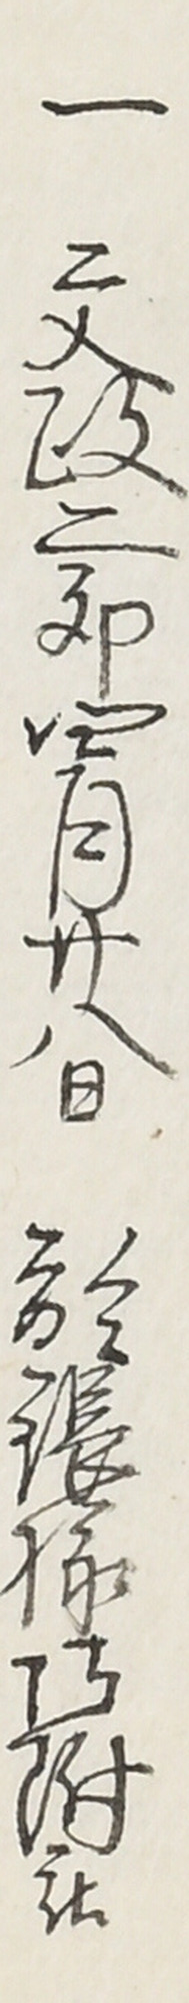一文政二卯四月廿八日於鋹様御附被
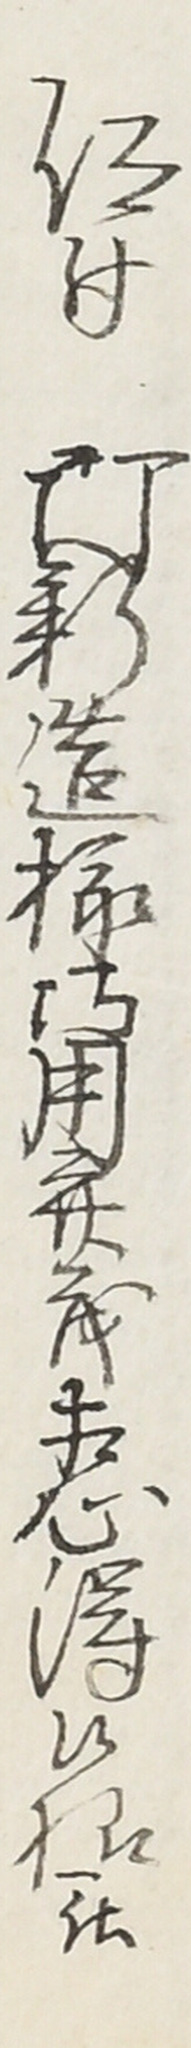仰付御新造様御用并も相心得候様被
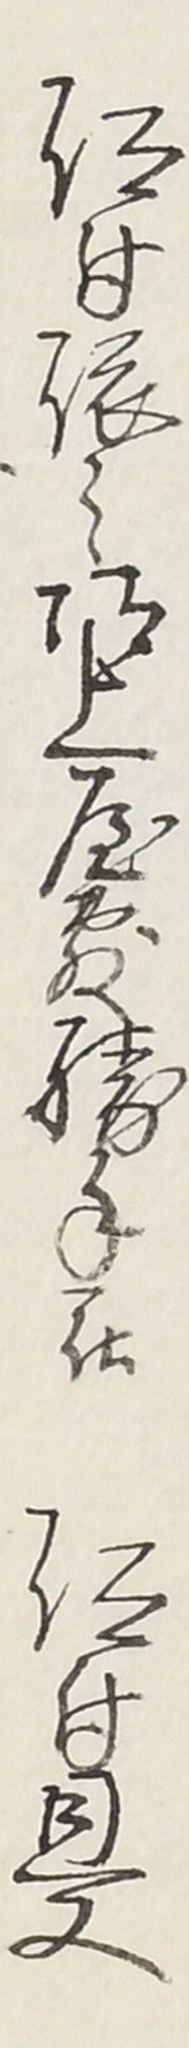仰付依之仰付上屋敷勝手被仰付且又
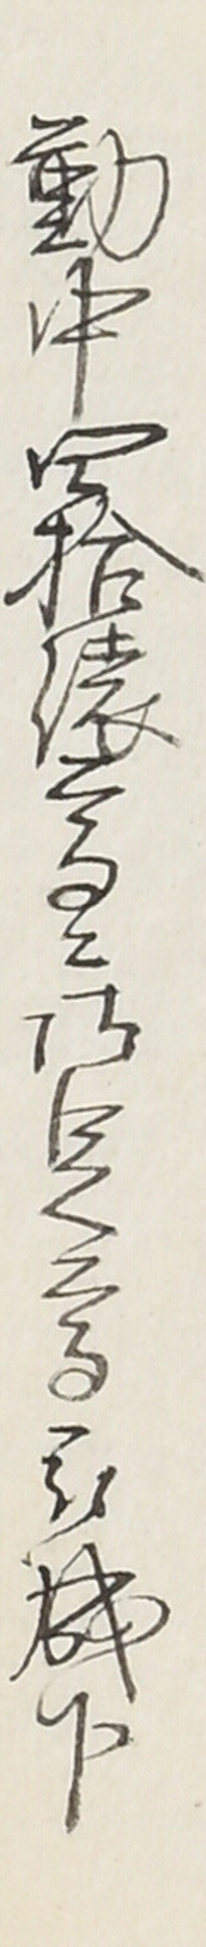勤中四拾俵高御足高被成下
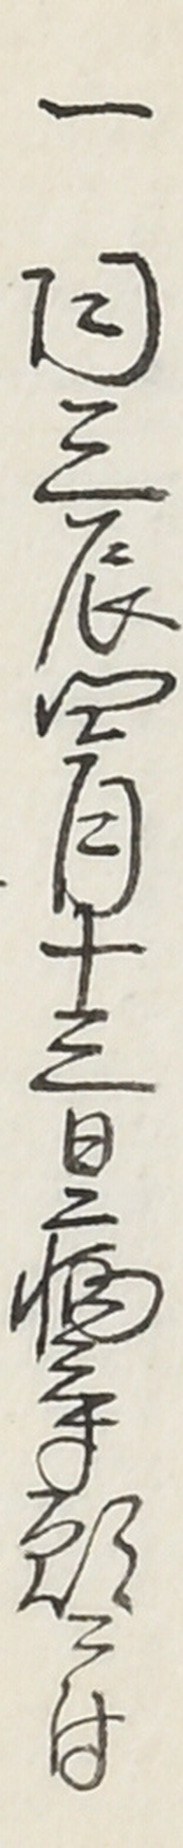一同三辰四月十三日病気願ニ付
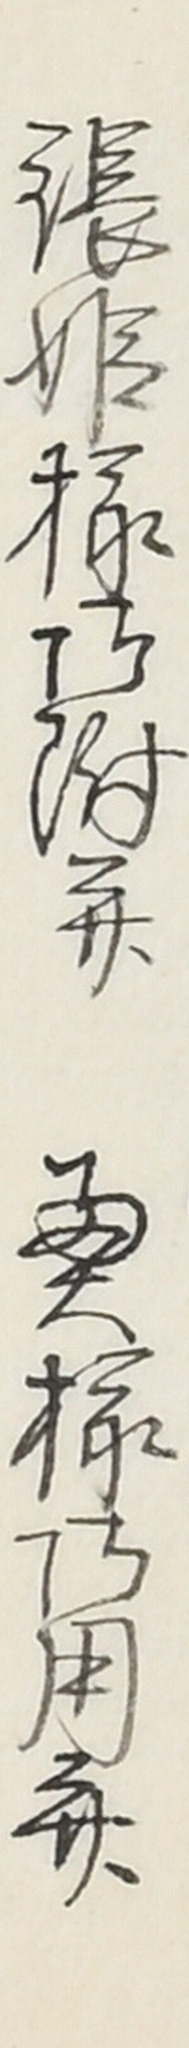鋹姫様御附并奥様御用并
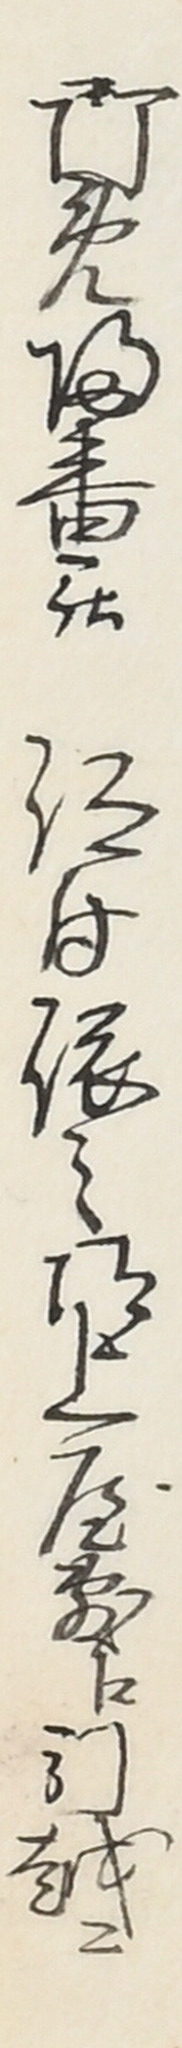御免帰番被仰付依之御上屋敷江引越ニ

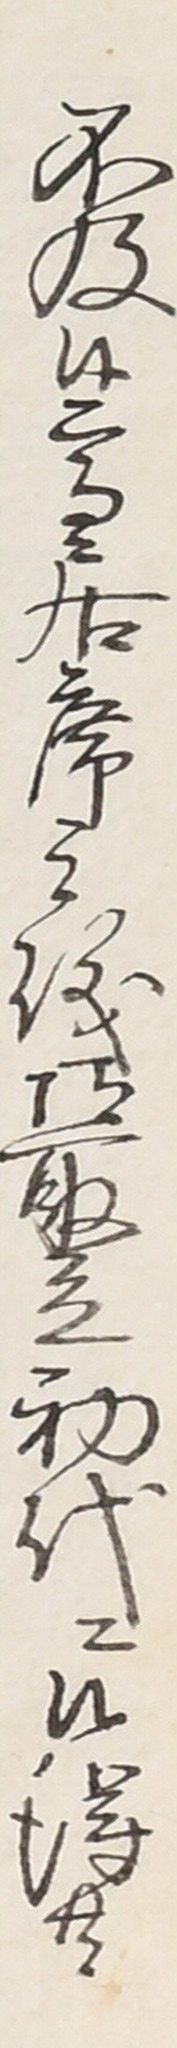不及候高居席之儀御取立初代ニ候得共
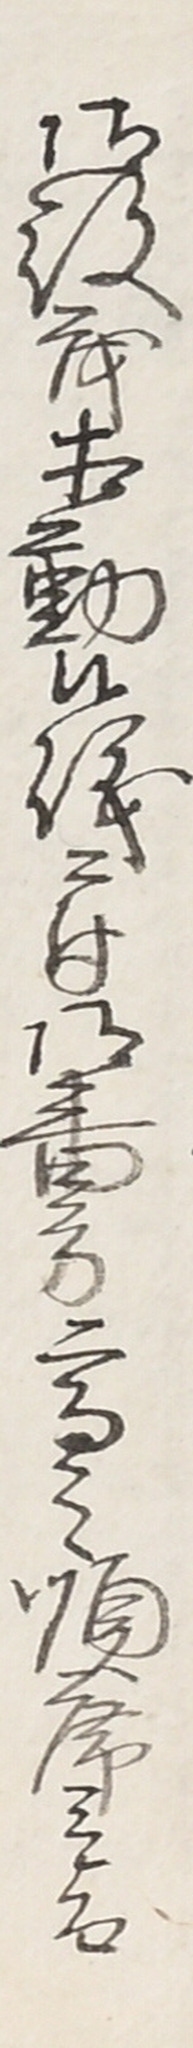御役も相勤候儀ニ付御番方た高之順席之旨
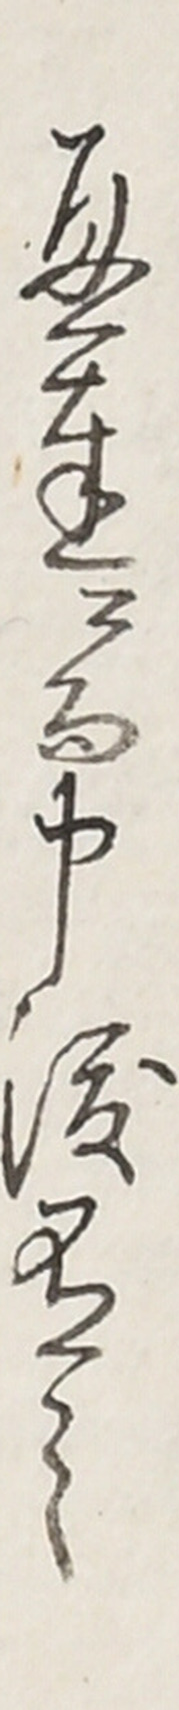通達ニ而申渡有之
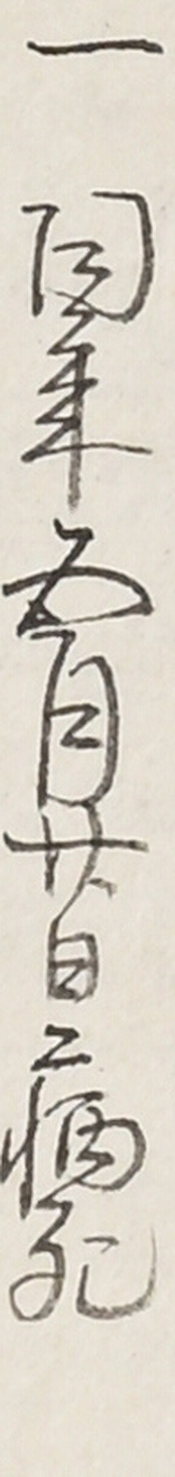一同年五月廿日病死
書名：給人諸士勤仕録（七）
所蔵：伊那市立高遠町図書館・合同会社AMANE
